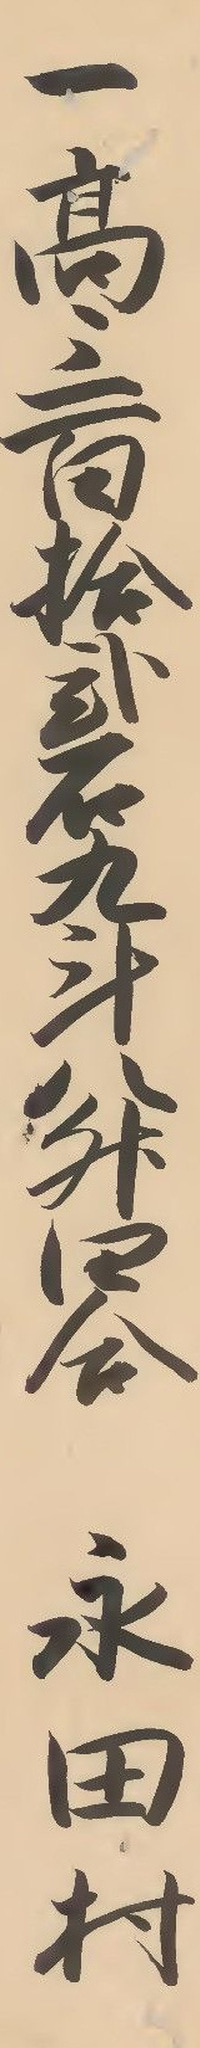一高三百拾弐石九斗八升四合永田村
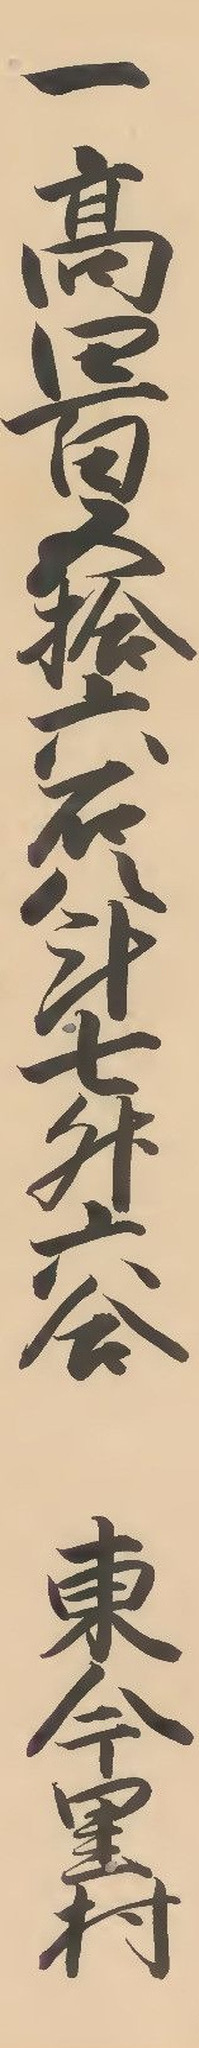一高四百五拾六石八斗七升六合東今里村

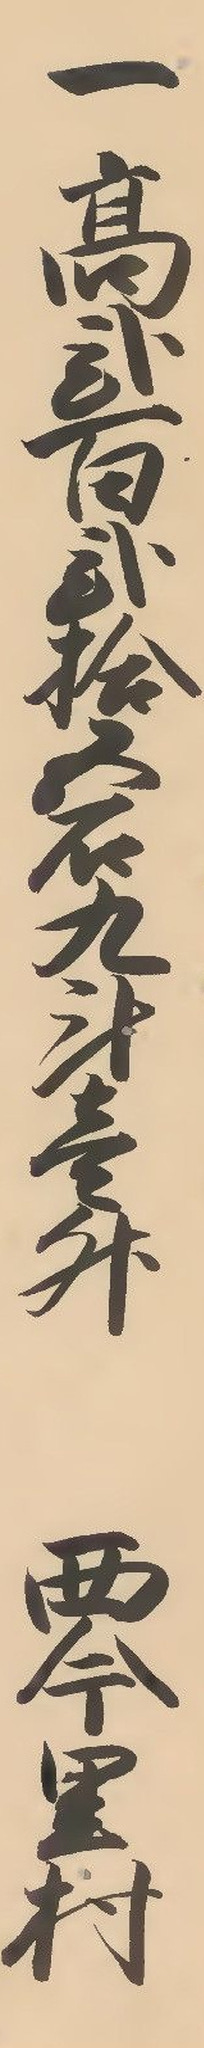一高弐百弐拾五石九斗壱升西今里村
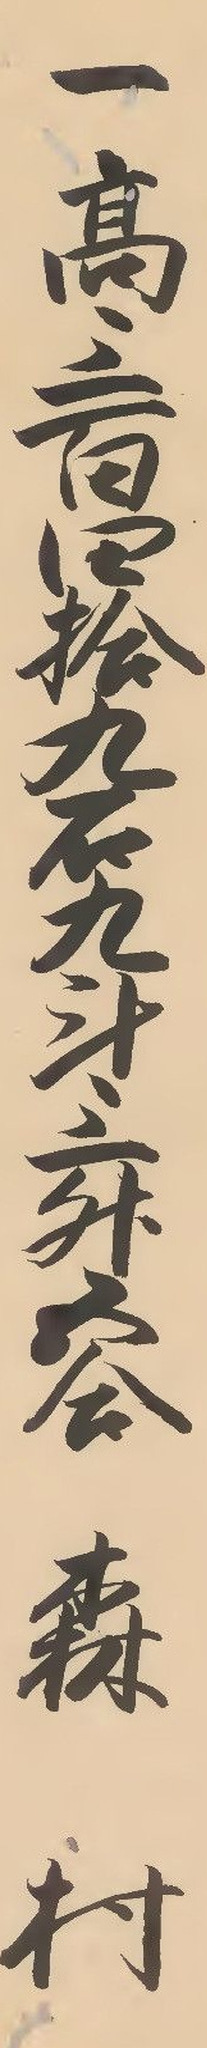一高三百四拾九石九斗三升五合森村
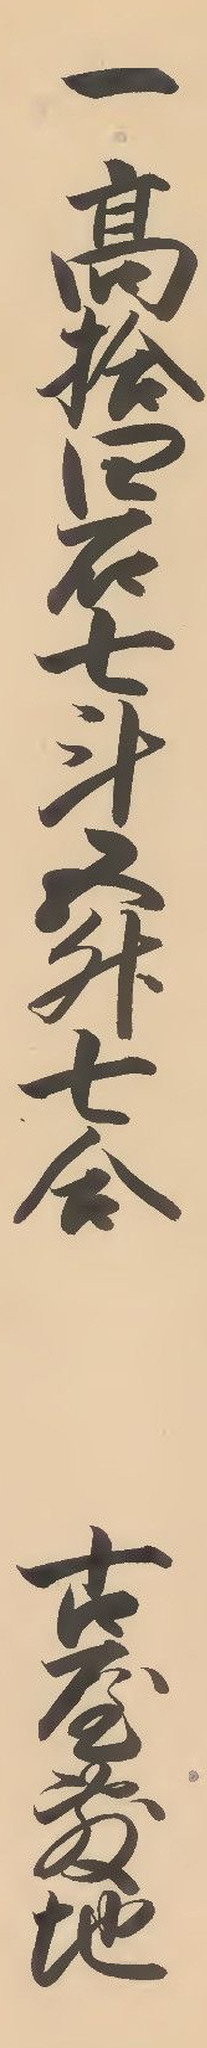一高拾四石七斗五升七合古屋敷地
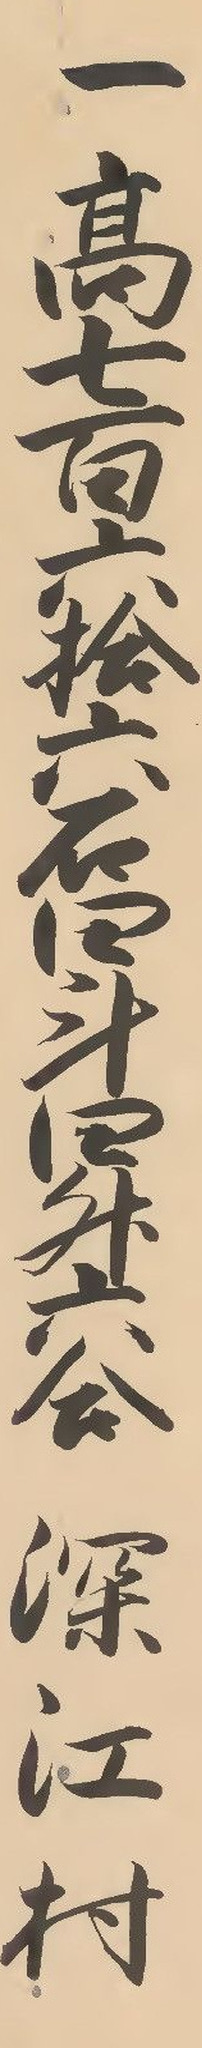一高七百六拾六石四斗四升六合深江村
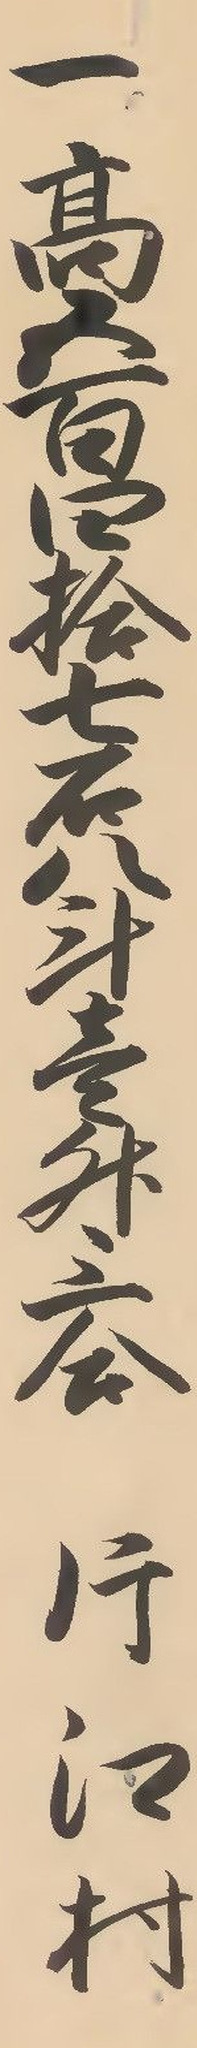一高五百四拾七石八斗壱升三合片江村
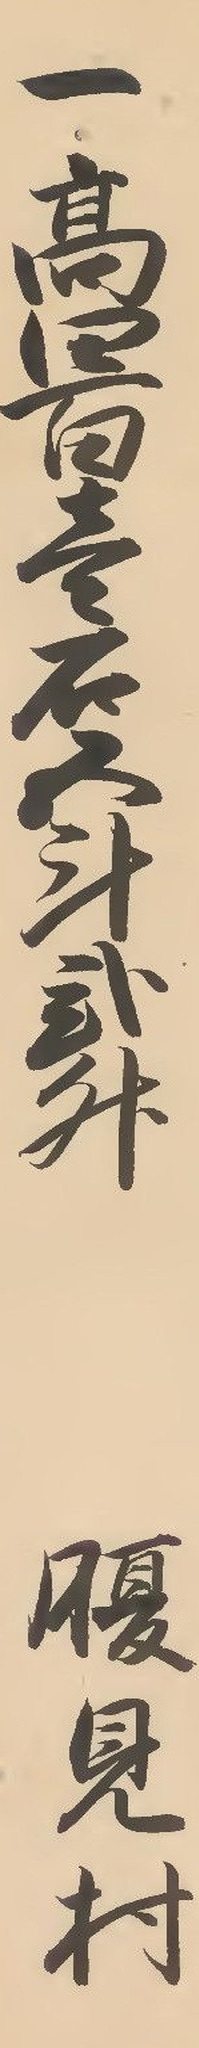一高四百壱石五斗弐升腹見村
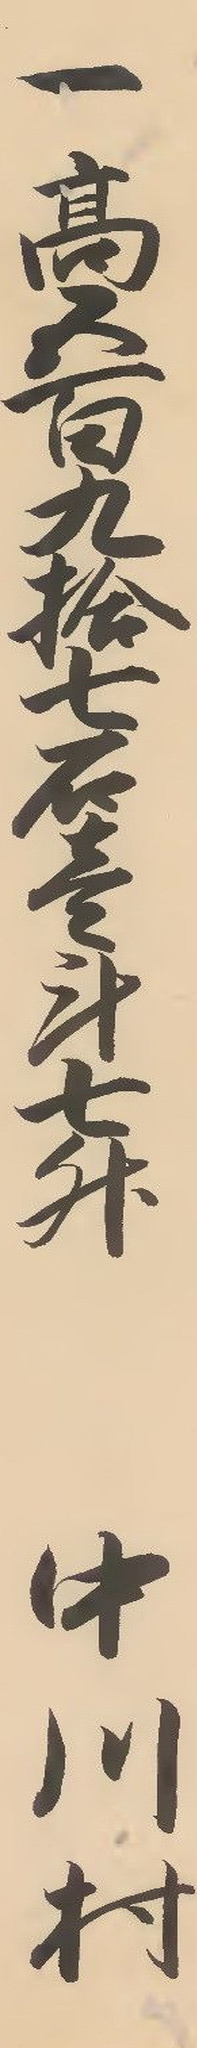一高五百九拾七石壱斗七升中川村
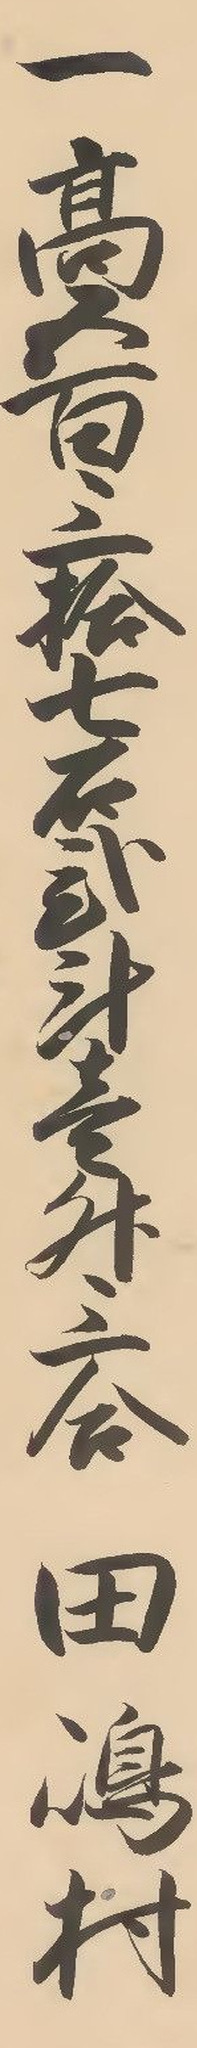一高五百三拾七石弐斗壱升三合田島村

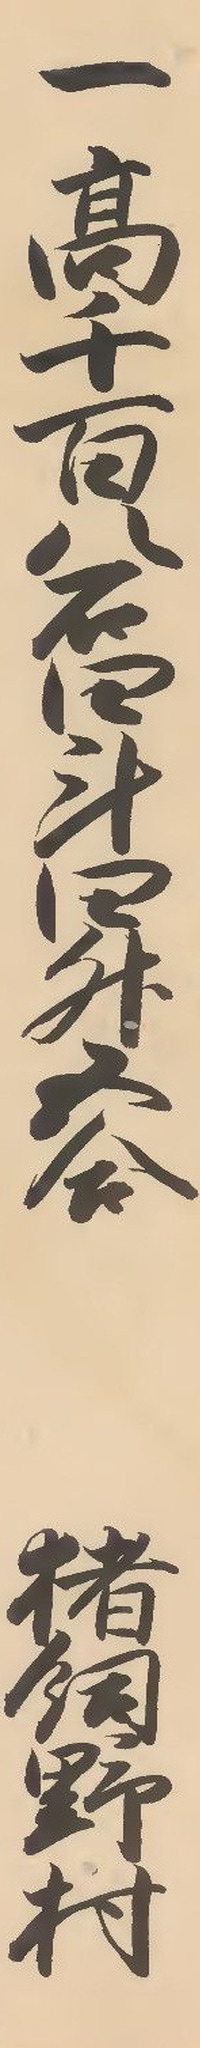一高千百八石四斗四升五合猪飼野村
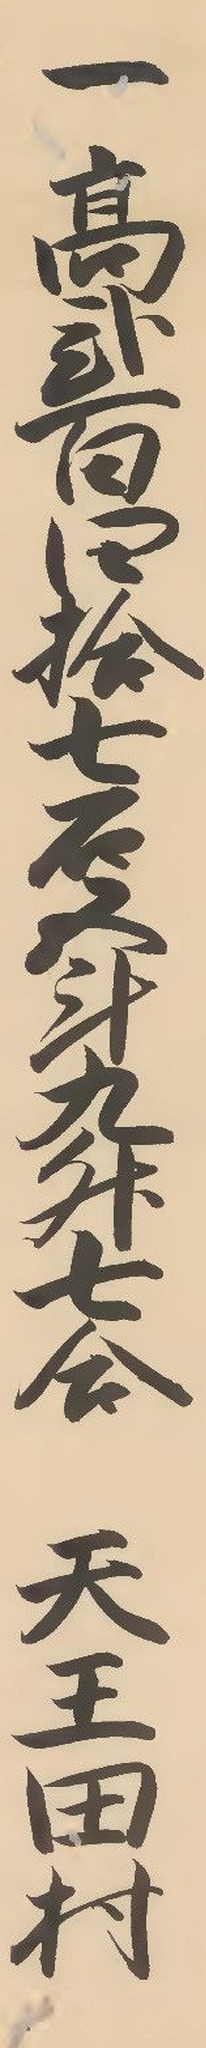一高弐百四拾七石五斗九升七合天王田村
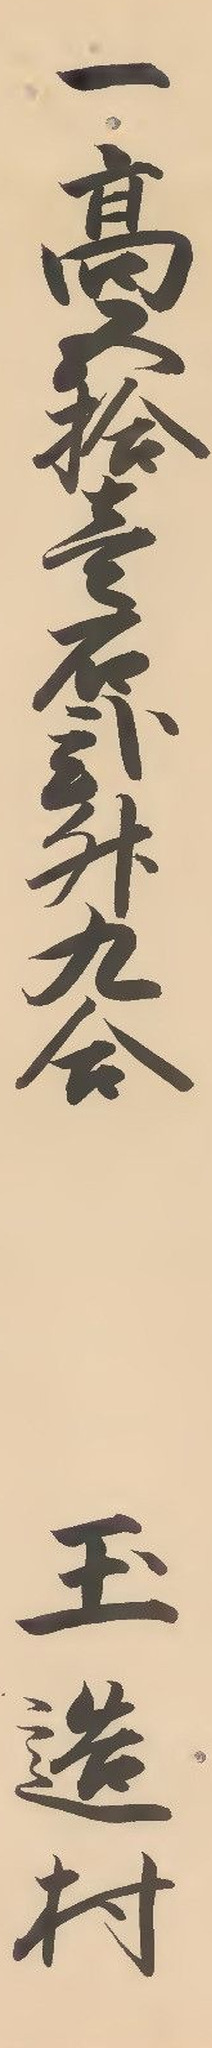一高五拾壱石弐升九合玉造村
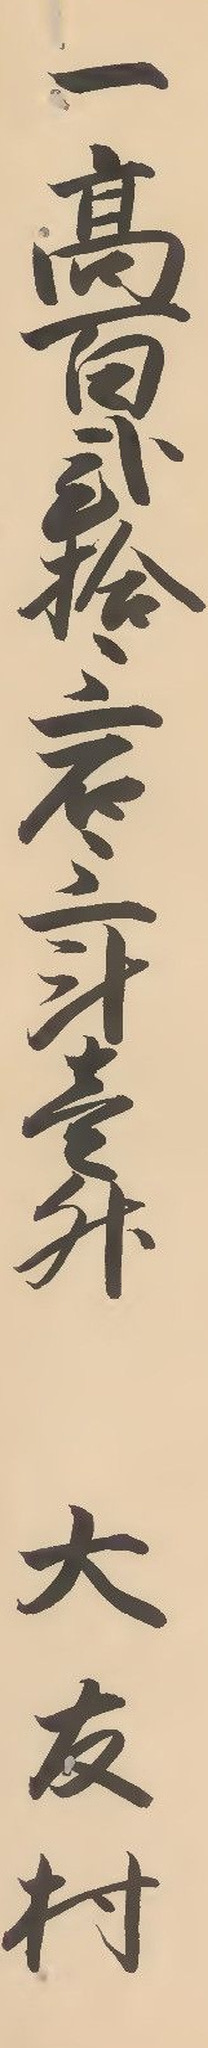一高百弐拾三石三斗壱升大友村
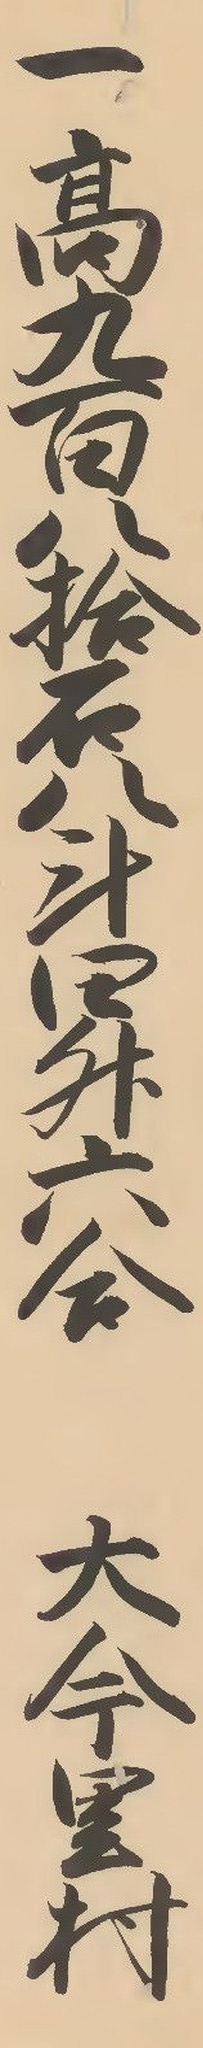一高九百八拾石八斗四升六合大今里村
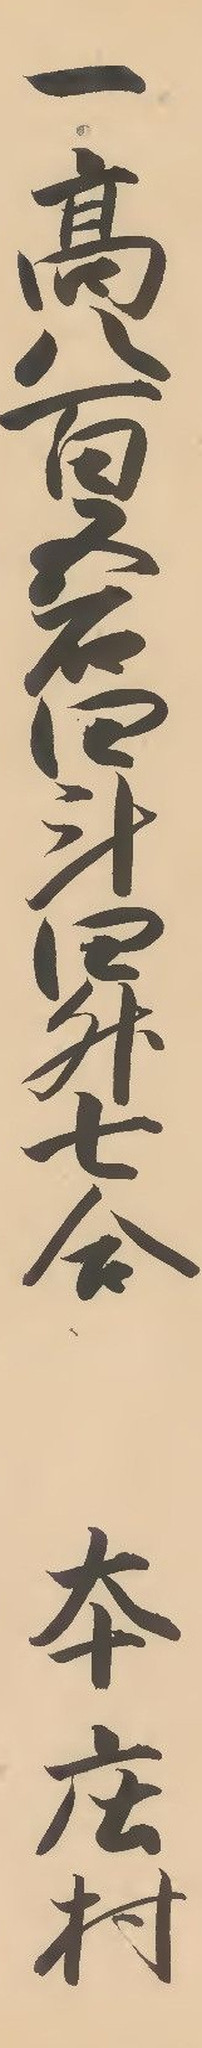一高八百五石四斗四升七合本庄村
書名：摂津国郷帳
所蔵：国立公文書館 National Archives of Japan
